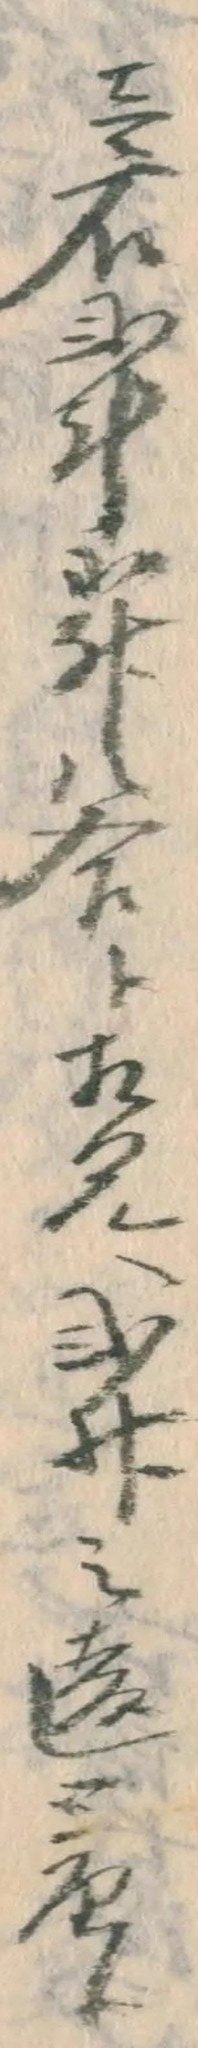壱石弐斗弐升八合と相見へ弐升之違御座候
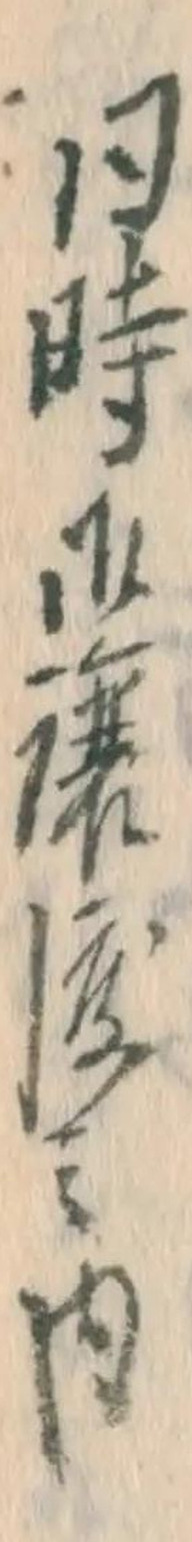同時御譲渡之内

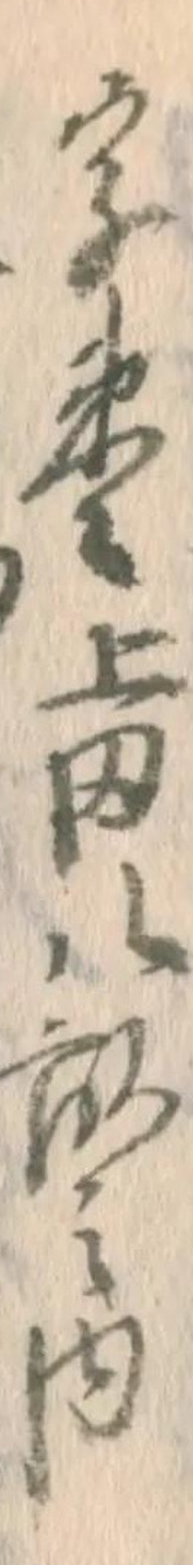字束之上田八畝之内
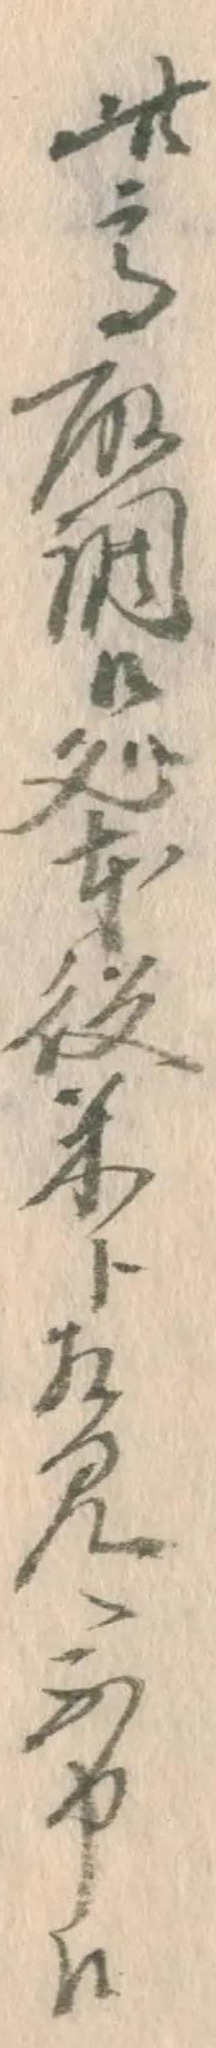此高取調候処本役米ト相見へ不申候
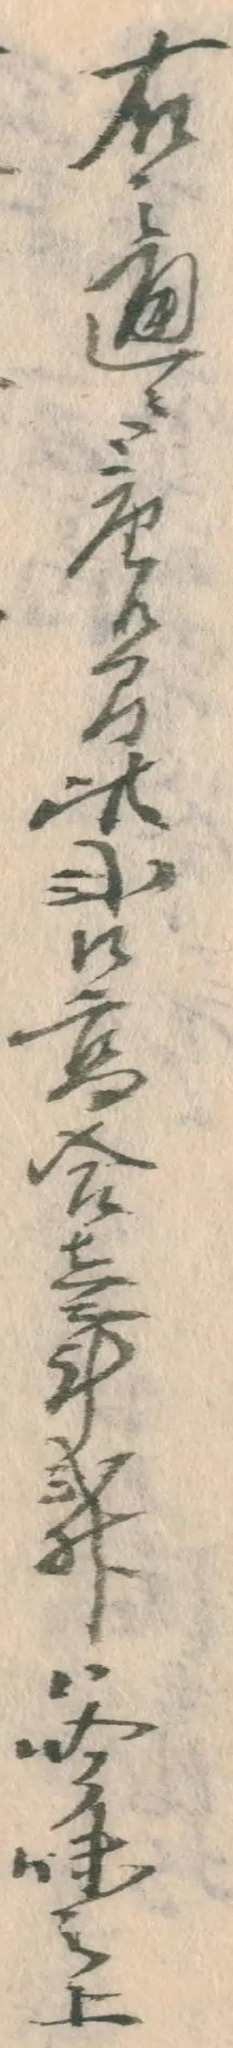右之通二御座候間此弐御高合壱斗弐升御吟味之上
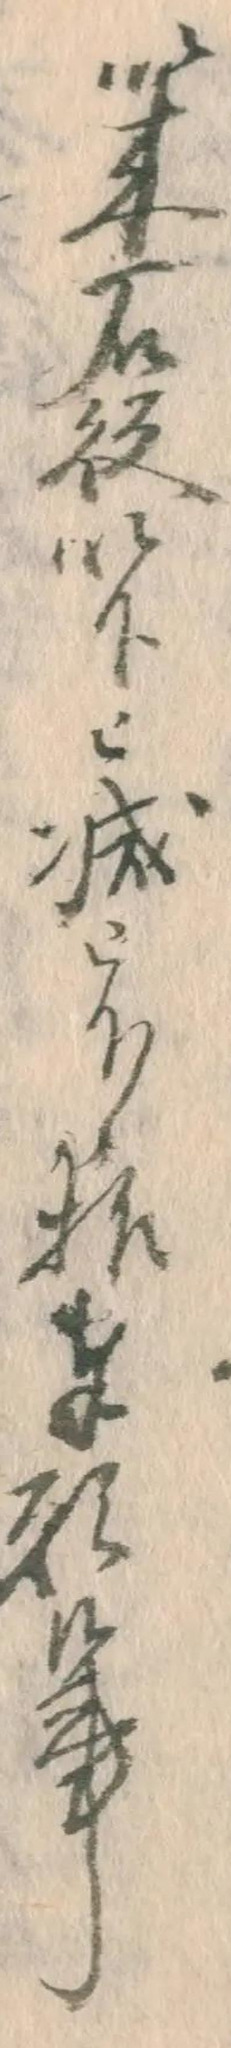以来右役以下被滅被下候様奉願候事
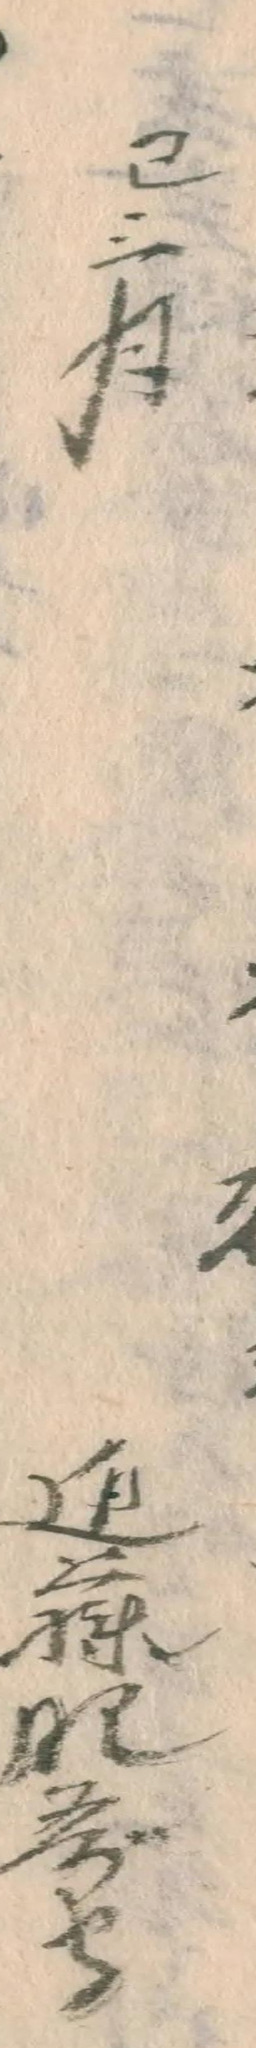巳三月近藤肥前守
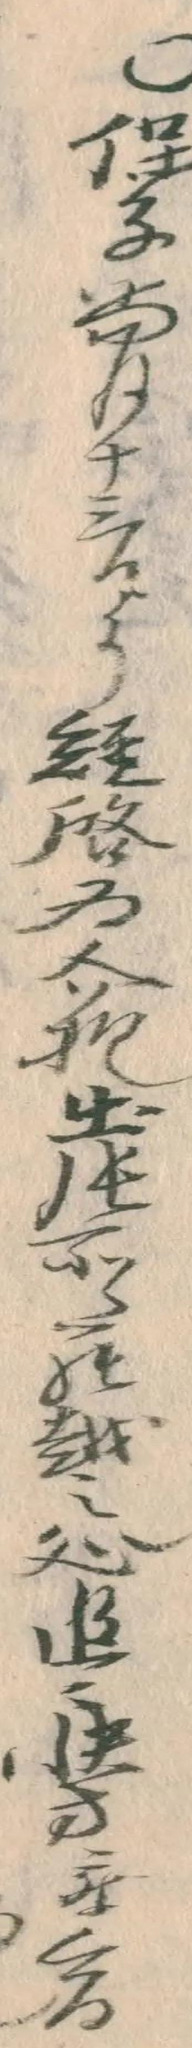○保子當月十三日より経啓為介抱出張所へ罷越之処追々快方ニ付今日帰宅也
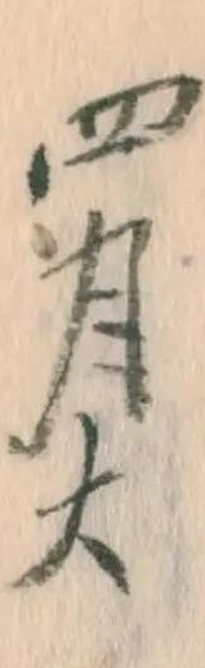四月大
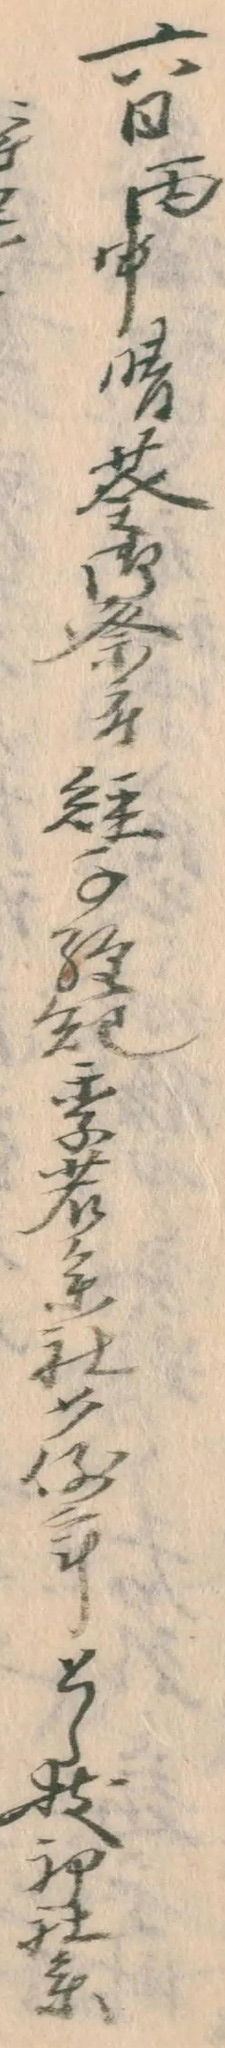六日丙申晴葵御祭ニ付経千経紀経季若参社如例年とし枝神社参
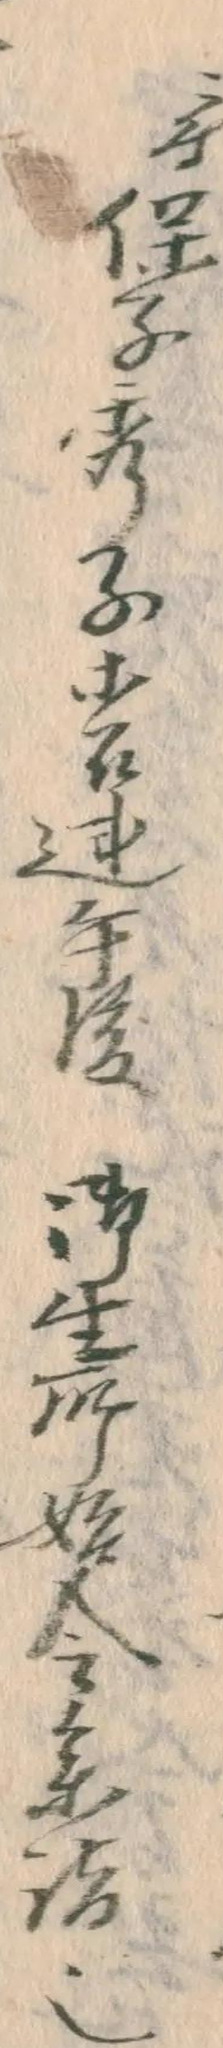ニ付保子秀子等召連午後御生所始令参詣也
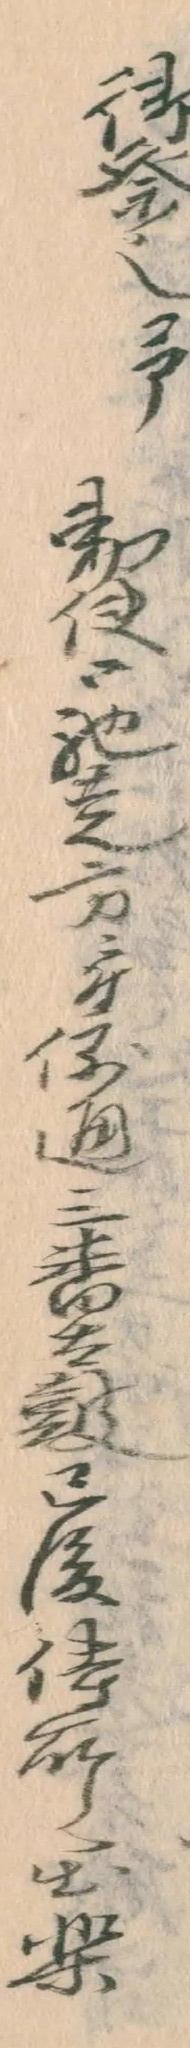御祭也予勅使御馳走方ニ付例通三番太皷已後侍所へ出楽
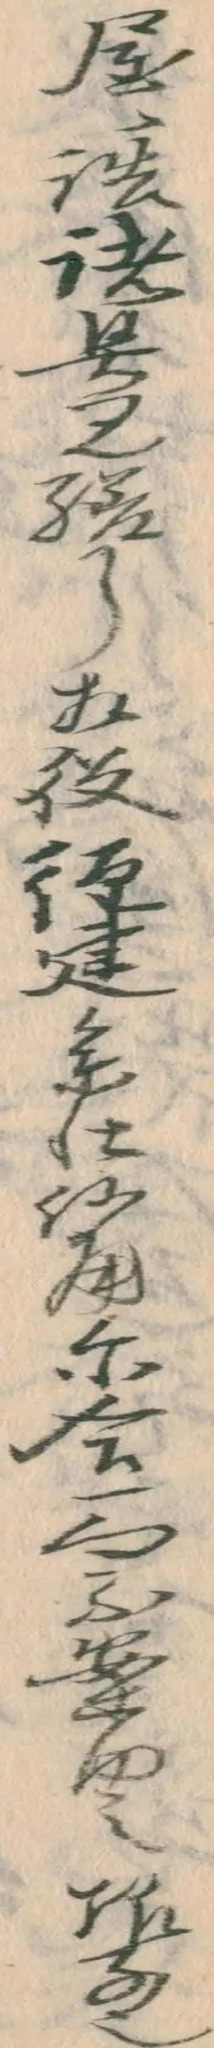屋ヘ詰諸具見繕了相役経建参仕何角尓合一向不案内之様子也
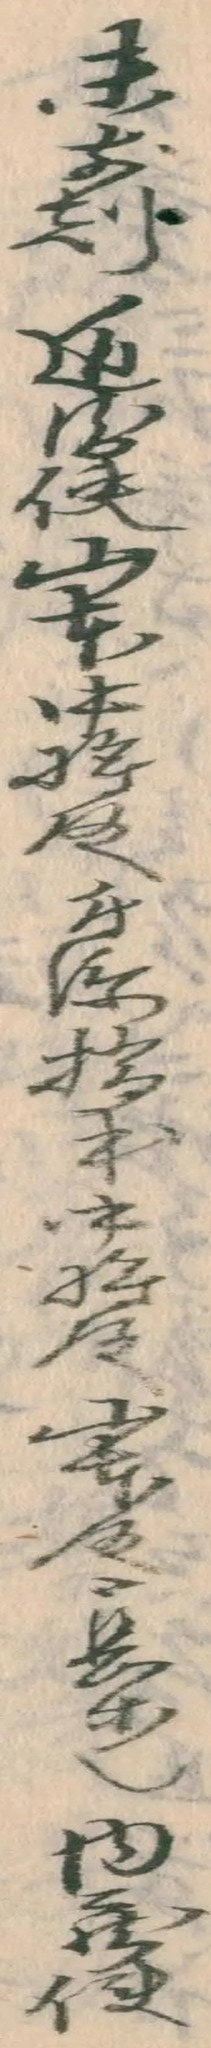未前刻近衛使山本中将殿付添橋本中将殿山本殿御息等也内蔵使
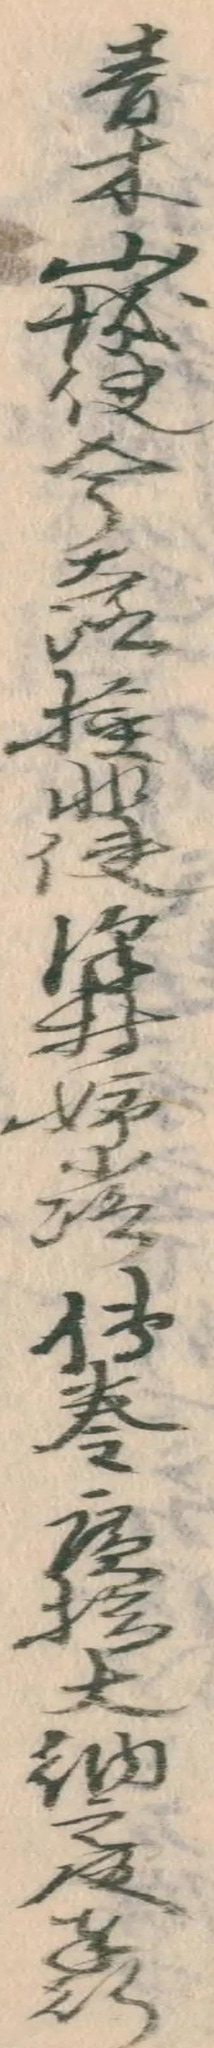青木山城使今大路検非使津村姉小路傳奏廣橋大納言殿奉行
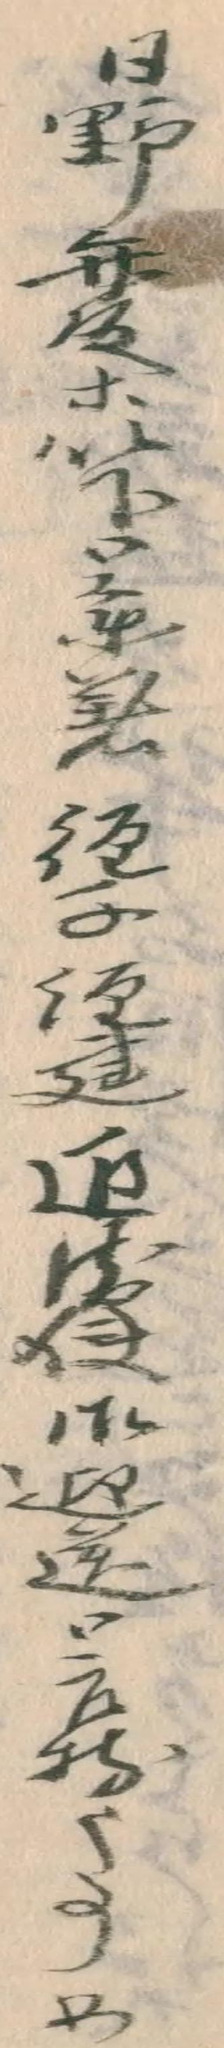日野弁殿等以下御参着経千経建近衛使御迎送御取持之事如
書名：賀茂社記録. 第70冊
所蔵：国立国会図書館 National Diet Library, JAPAN
